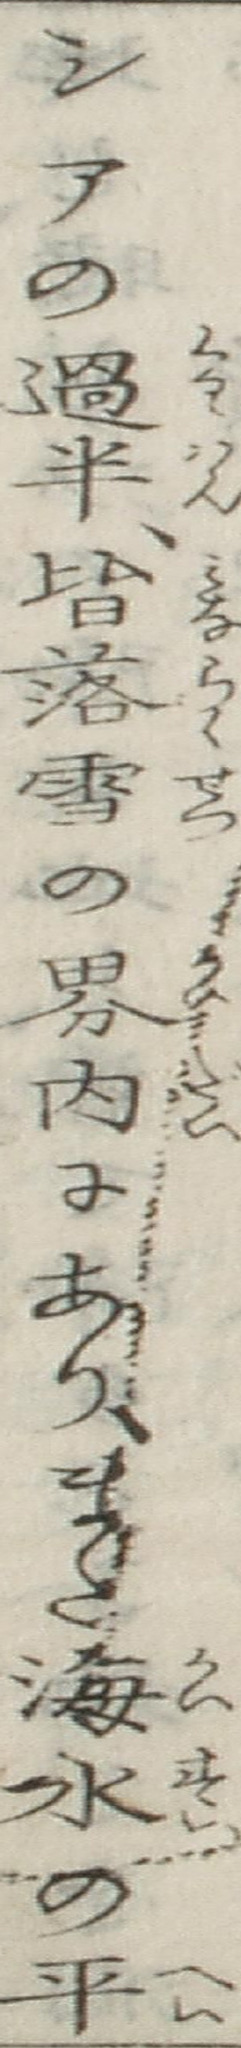シアの過半、皆落雪の界内にあり、また海水の平
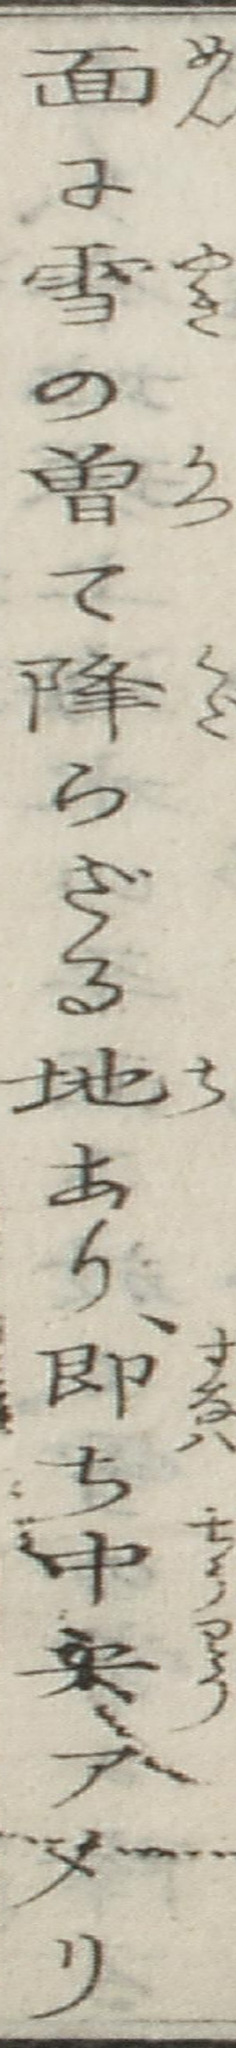面に雪の曽て降らざる地あり、即ち中央アメリ
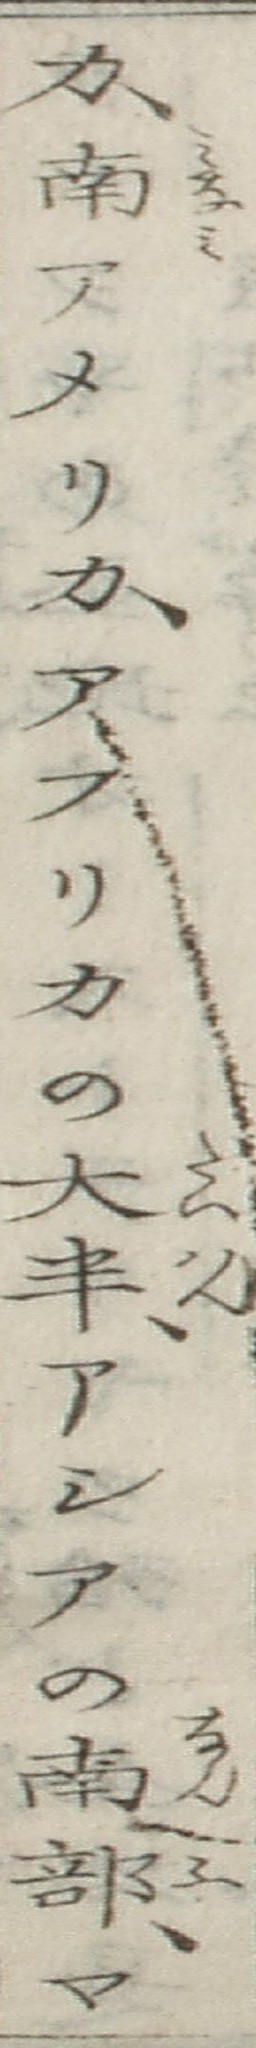カ、南アメリカ、アフリカの大半、アシアの南部、マ

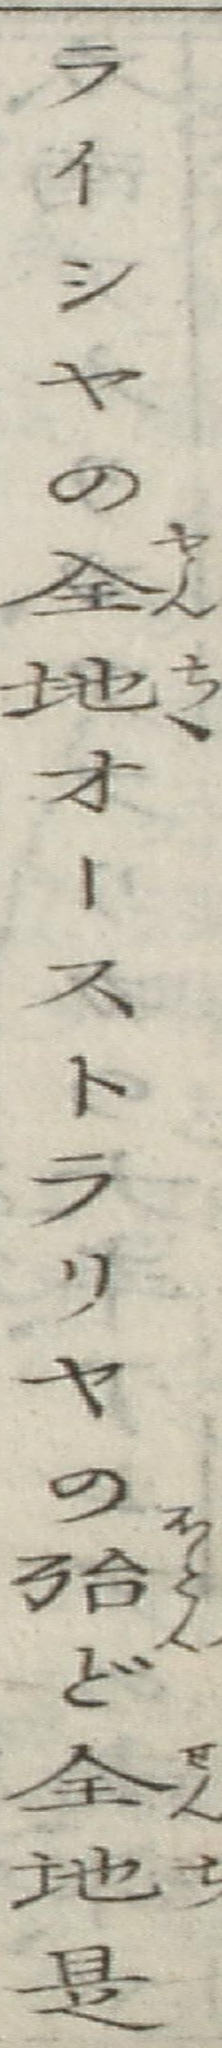ライシヤの全地、オーストラリヤの殆ど全地是
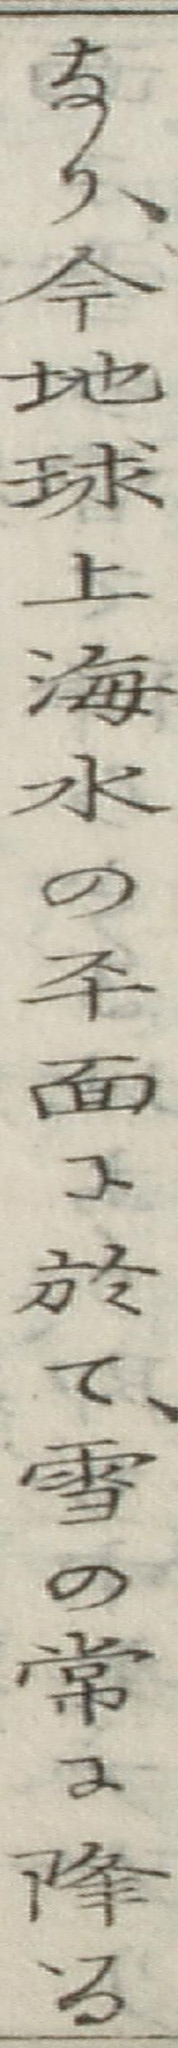なり、今地球上海水の平面に於て、雪の常に降る
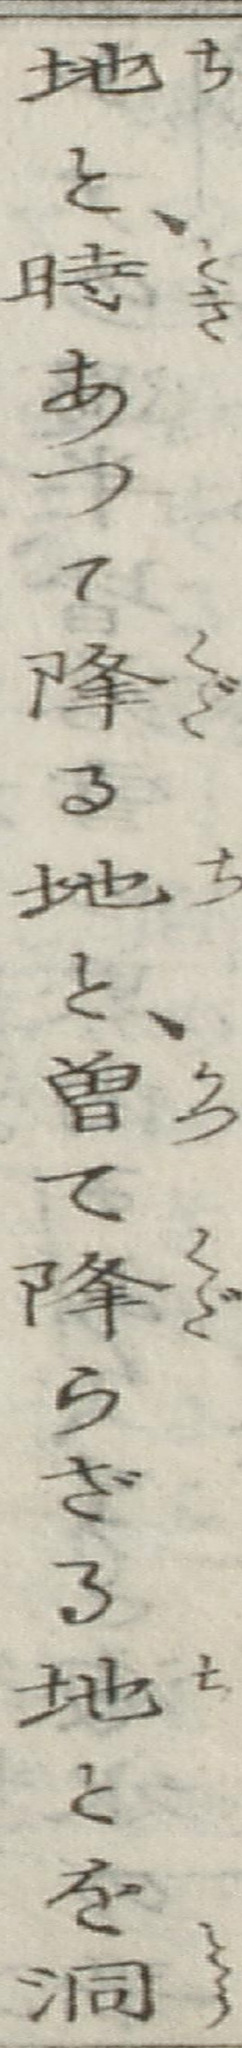地と、時あつて降る地と、曽て降らざる地とを洞
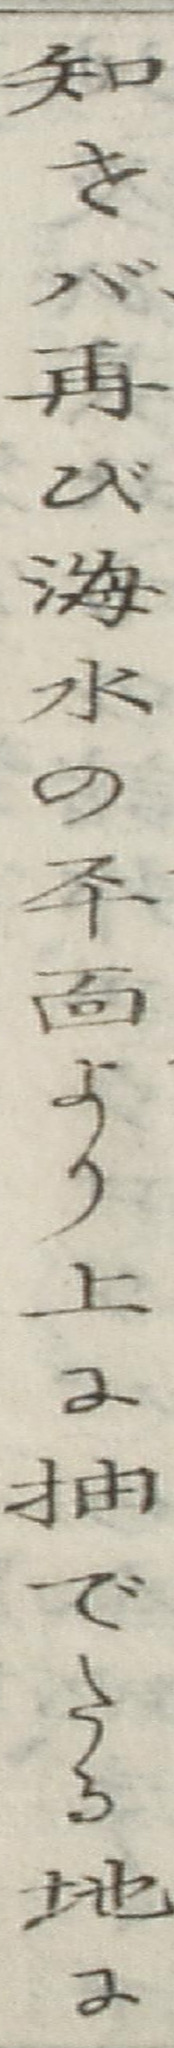知せば、再び海水の平面より上に抽でたる地に
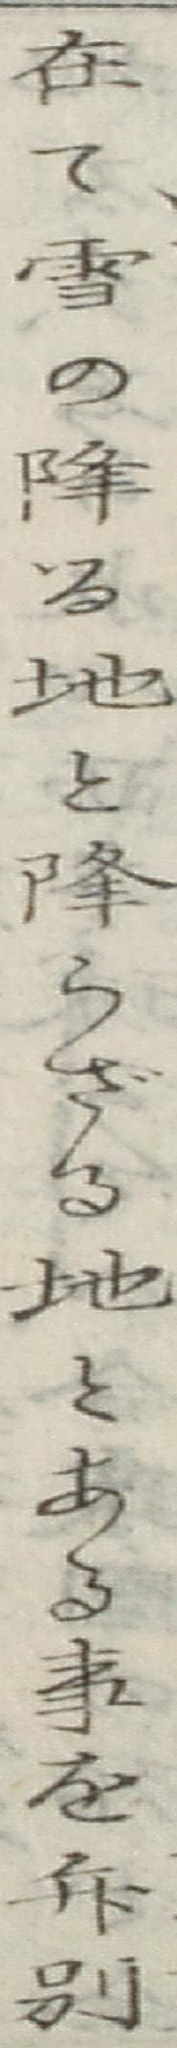在て、雪の降る地と降らざる地とある事を弁別
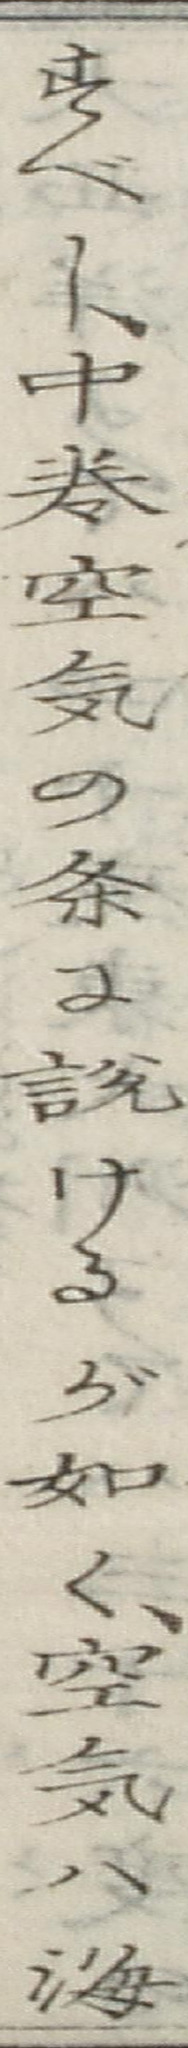すべし、中巻空気の条に説けるが如く、空気は海
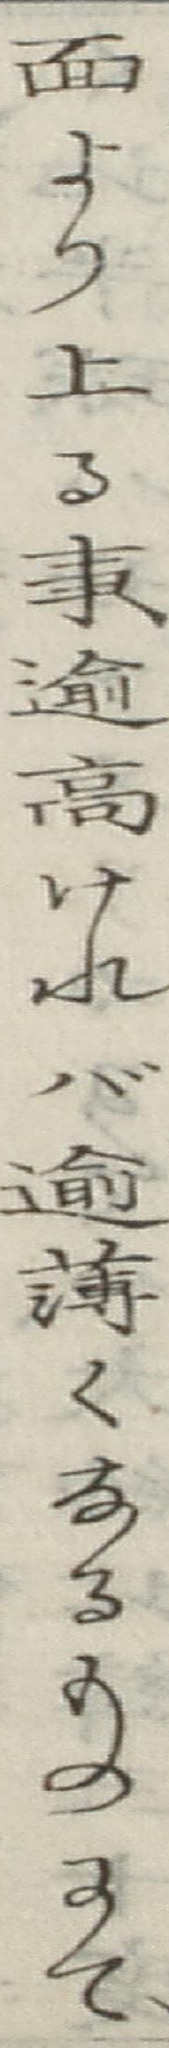面より上る事逾高ければ、逾薄くなるものにて、
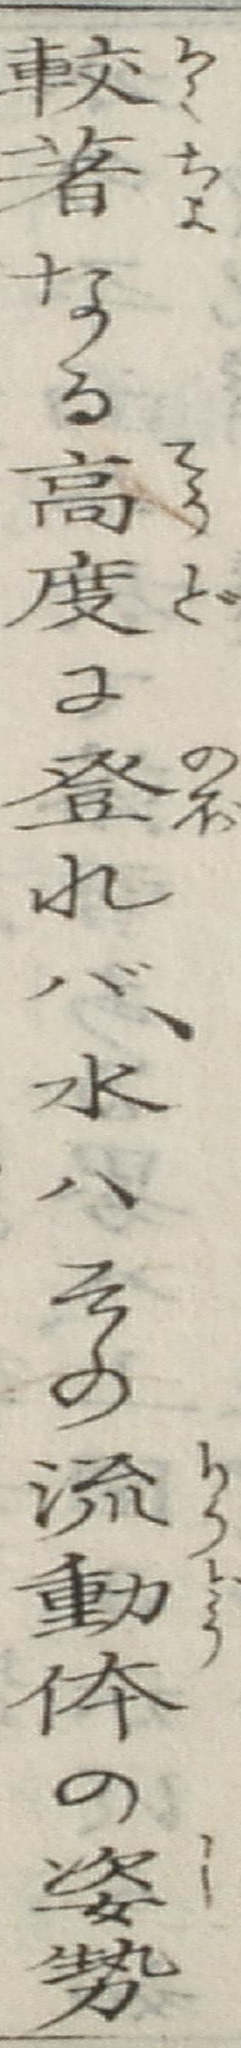較著なる高度に登れば、水はその流動体の姿勢
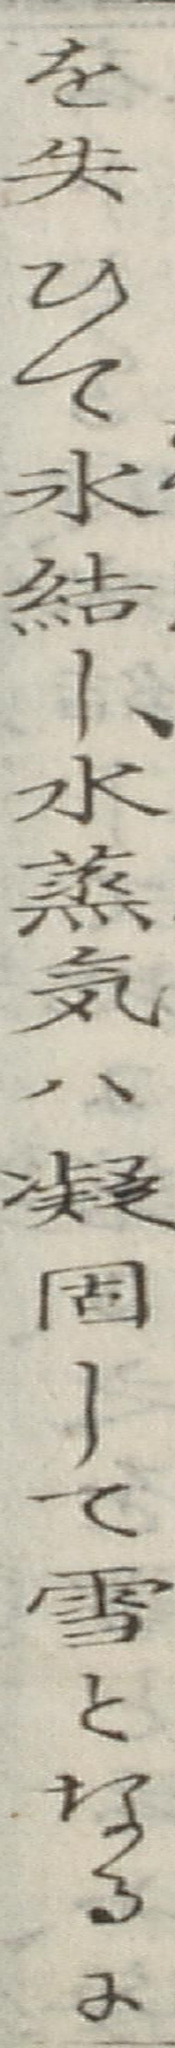を失ひて氷結し、水蒸気は凝固して雪となるに
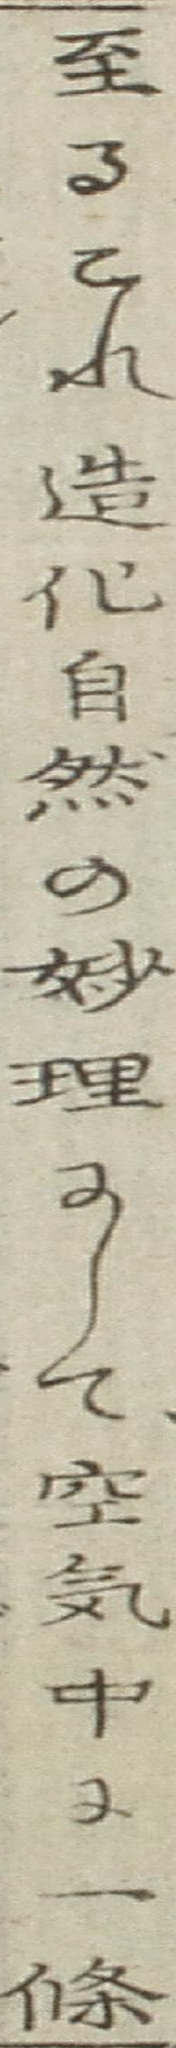至る、これ造化自然の妙理にして、空気中に一条
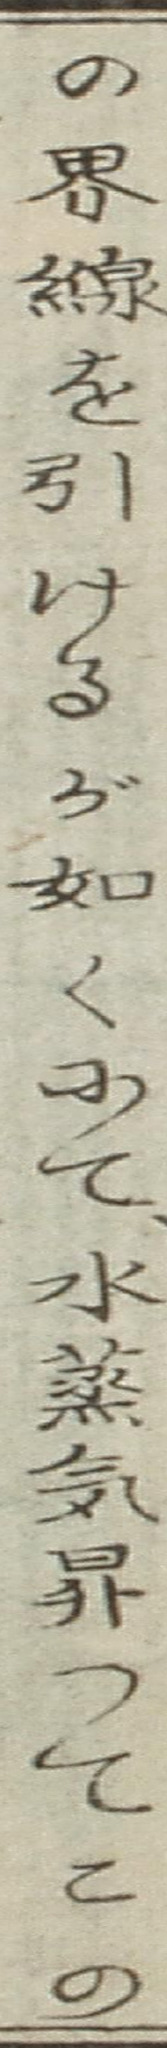の界線を引けるが如くにて、水蒸気昇つてこの
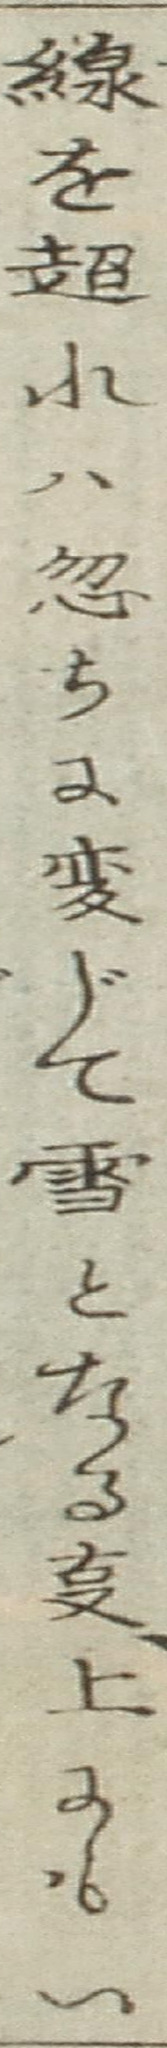線を超れは忽ちに変じて雪となる事、上にもい
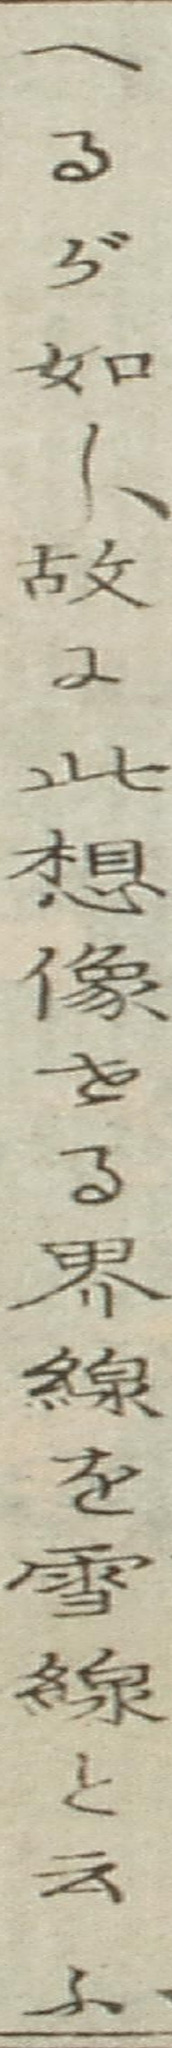へるが如し、故に此想像せる界線を雪線といふ、
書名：訓蒙　天然地理學　下
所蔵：東京大学地震研究所図書室 Earthquake Research Institute Library, The University of Tokyo, JAPAN
